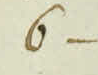6
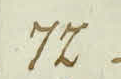72
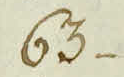63
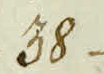38
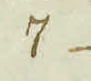7
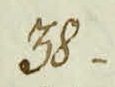38
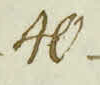40
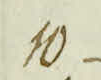10
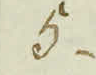5
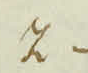2
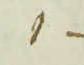1
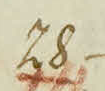28
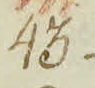43
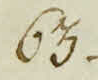63
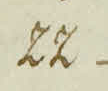22
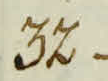32
